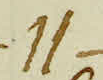11
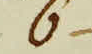6
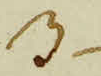3
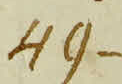49
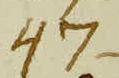47
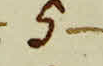5
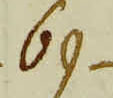69
